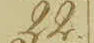22.
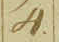4.
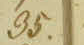35.
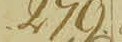279.
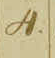4.
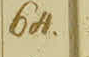64.
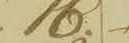16.
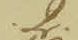2.
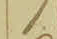1.
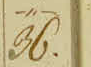36.
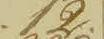12.
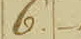6.
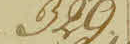329.
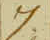7.
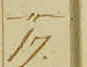17.
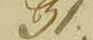31.
